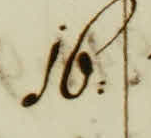16:
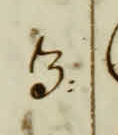3:
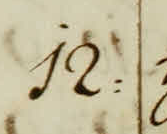12:
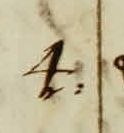4:
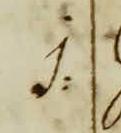1:
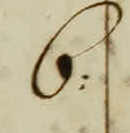6:
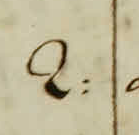2:
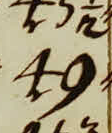49
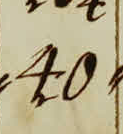40
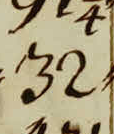32
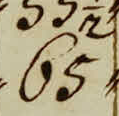65
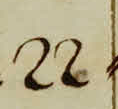22
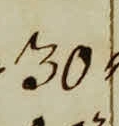30
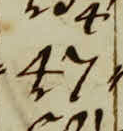47
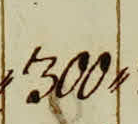300
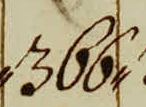366
